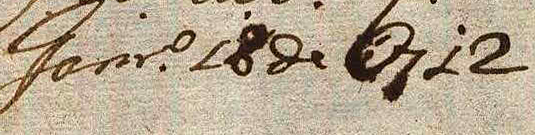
Janr.o 18 de 17i2
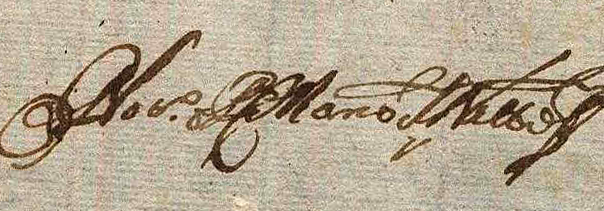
Not.o Pe. Manoel Vasco
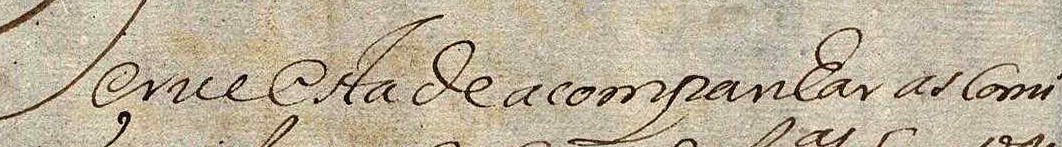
Serue esta de acompanhar as comi
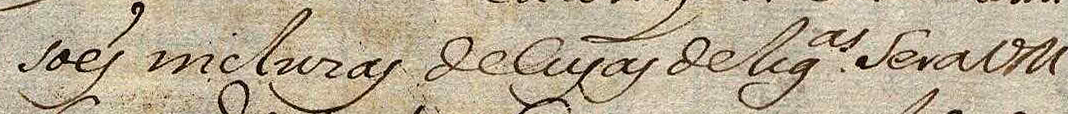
soẽs incluzas de cujas delig.as sera V M
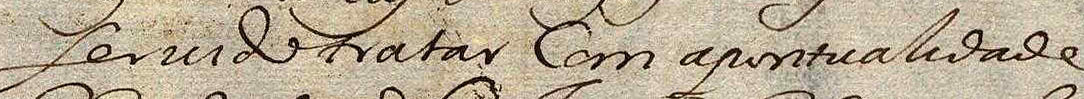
seruido tratar Com a pontualidade
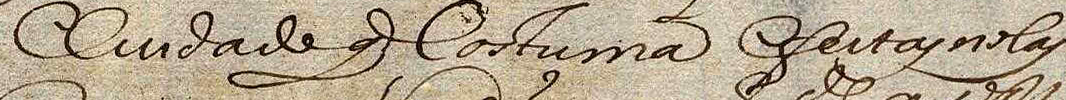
E Cuidado q̄ Costuma E feitas nelas
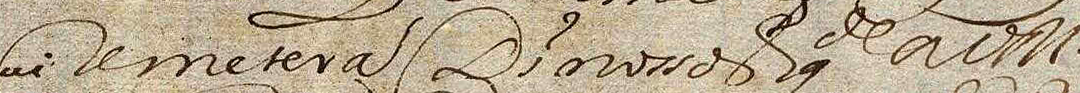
Remetera Ds̄ nosso s g.de a V M.
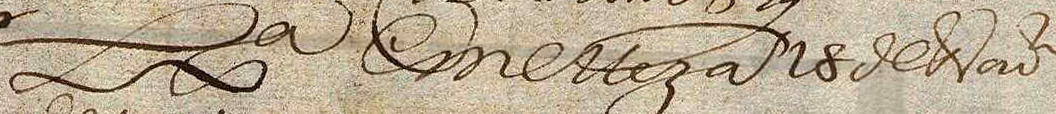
Lxa em Meza 18 de Nouro
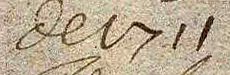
de 1711
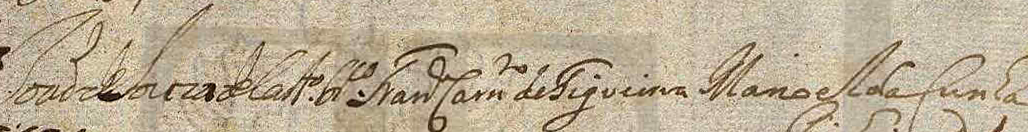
Joaõ de Souza de Cast.obr.co Fran.co Canro de Figueiroa Manoel da Cunha
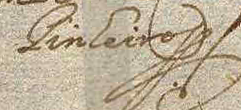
Pinheiro
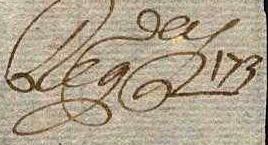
Regda f 173
